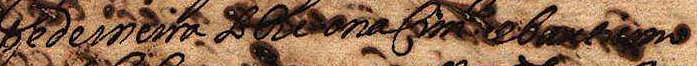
pederneira sobre o naCim.to e bautismo
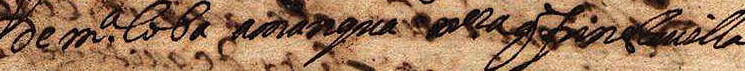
de ma. loba a manqua mra q̄ foi nesta uilla
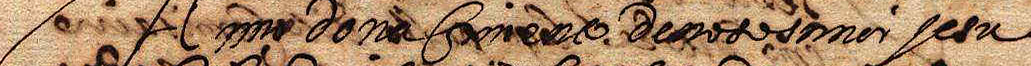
Anno do naCimento de noso snnor jesu
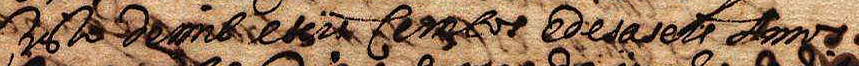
Christo de mil e seisCemtos e desasete Annos
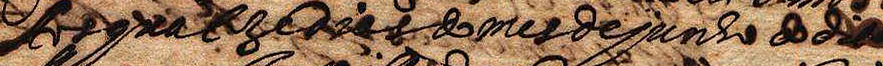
Aos quatorze dias do mes de junho do dito
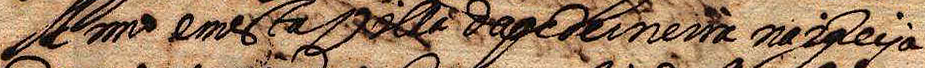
Anno em esta Villa da pederneira na igreija
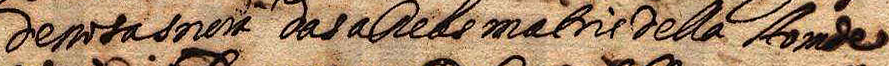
de nosa snora das aReas matris della Aomde
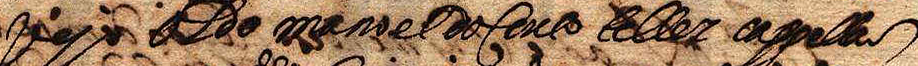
Vejo O Ldo manoel do Couto tellez cappelaõ
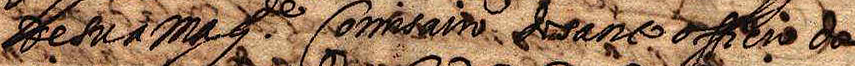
de sua mag.de Comisairo do santo officio da
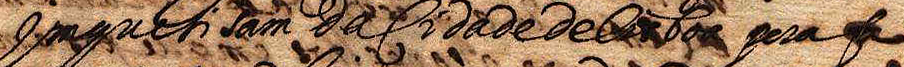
Jmquisisam da Cidade de lisboa pera fa
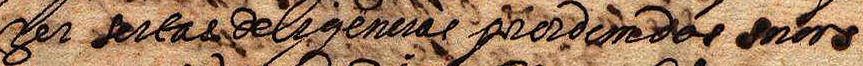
zer sertas deligencias por ordem dos snors
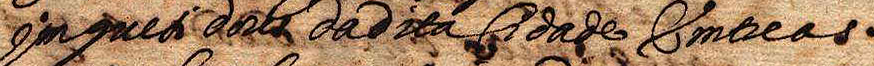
jmquisidores da dita Cidade &mtre as.
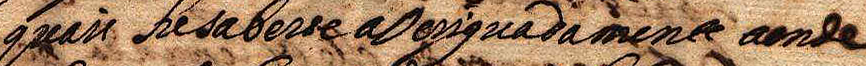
quais he saberse aVeriguadamente aonde
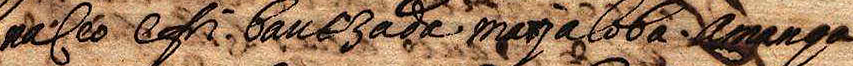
naCeo e foi bautizada marja loba a manqa
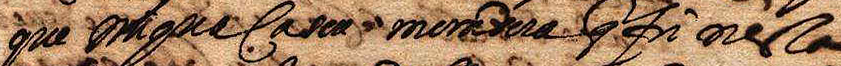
que nuqua Casou moradora q̄ foi nesta
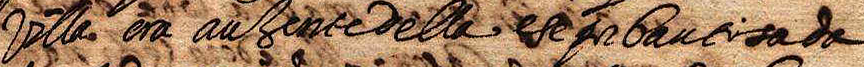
Villa era auzente della. e se por bautisada
